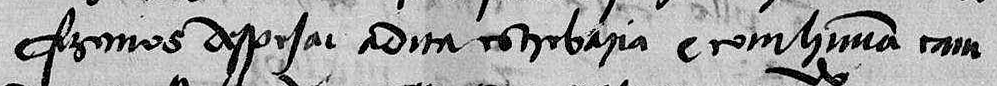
fizemos despeJar a dita estrebaria e com hūua cam
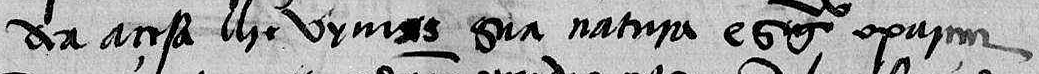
dea acesa lhe vymos sua natura e segdo o parecer
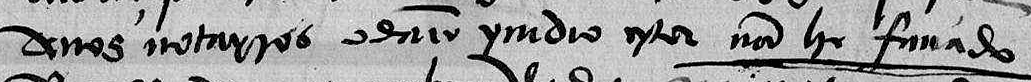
de nos notayros o ditto ymdio eytor nā he fanado
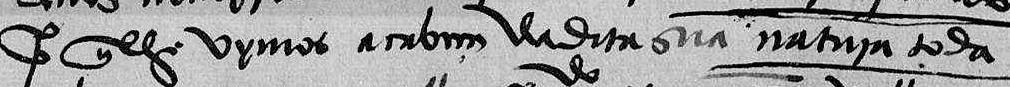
p̄o q̄ lhe vymos a cabeça da dita sua natura toda
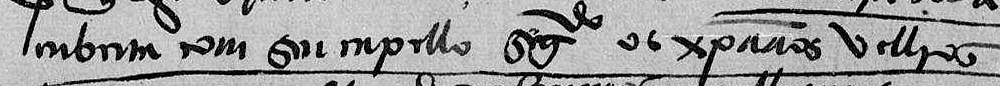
cuberta com seu capello segdo os xpaãos velhos
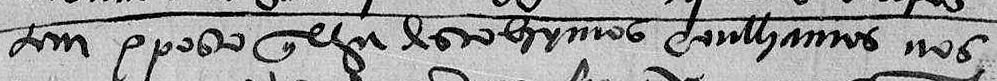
tem e posto q̄ lha descobrymos e oulhamos nos
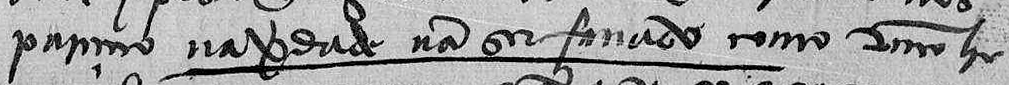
pareceeo na ꝟdade nā ser fanado como ditto he
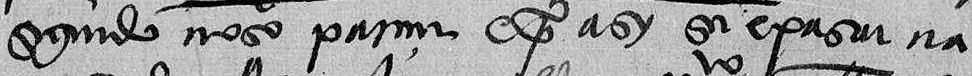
segundo noso parecer e p̄o asy ser e pasar na
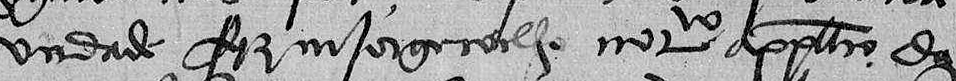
verdade fyz eu Jorge coelho notro ap̄pllco da
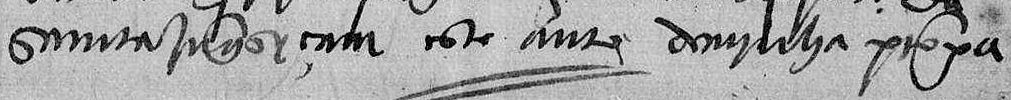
samta Jnq̄syçam este auto de mjnha prop̄a
